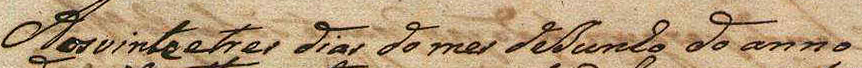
Aos vinte e tres dias do mes de Iunho do anno
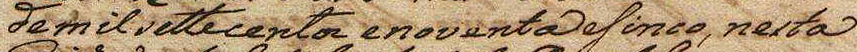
de mil settecentos e noventa e sinco, nesta
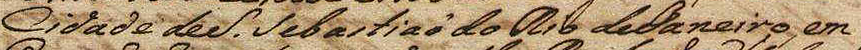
Cidade de S. Sebastiaõ do Rio de Ianeiro, em
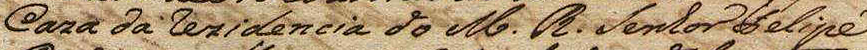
Caza da Rezidencia do M. R. Senhor Felipe
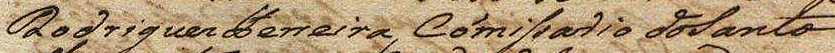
Rodriguez Ferreira, Comissario do Santo
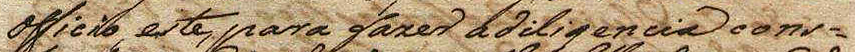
officio este, para fazer a diligencia cons
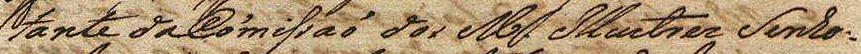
tante da Comissaõ dos M Illustrez Senho
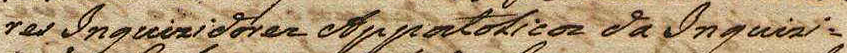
res Inquizidorez Appostolicoz da Inquizi
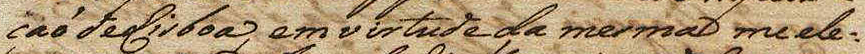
çaõ de Lisboa, em virtude da mesma me ele
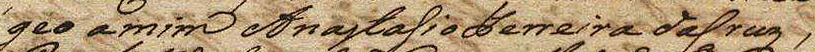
geo a mim Anastasio Ferreira da Cruz,
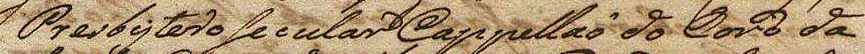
Presbytero secular Cappellaõ do Coro da
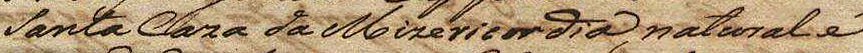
Santa Caza da Mizericordia, natural e
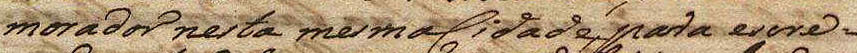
morador nesta mesma Cidade, para escre
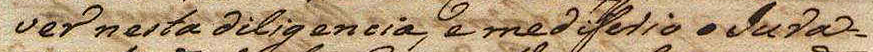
ver nesta diligencia, e me diferio o Iura
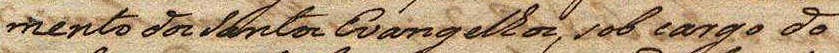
mento dos santos Evangelhos, sob cargo do
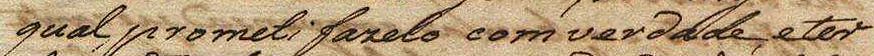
qual, prometi fazelo com verdade, e ter
